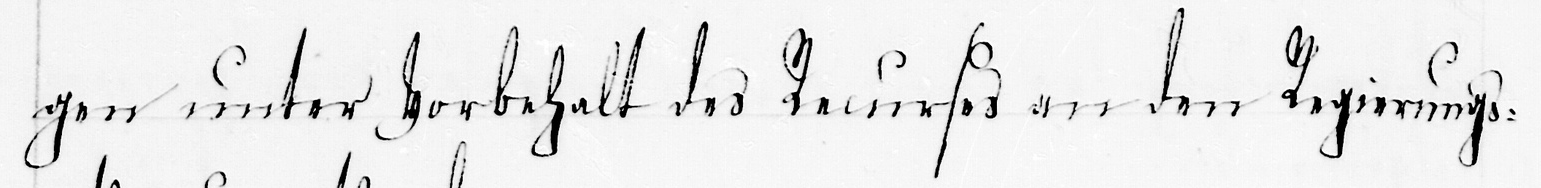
gen unter Vorbehalt des Recurses an den Regierungs¬
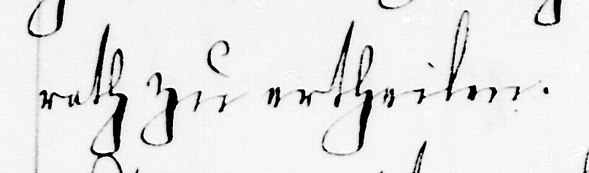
rath zu ertheilen.
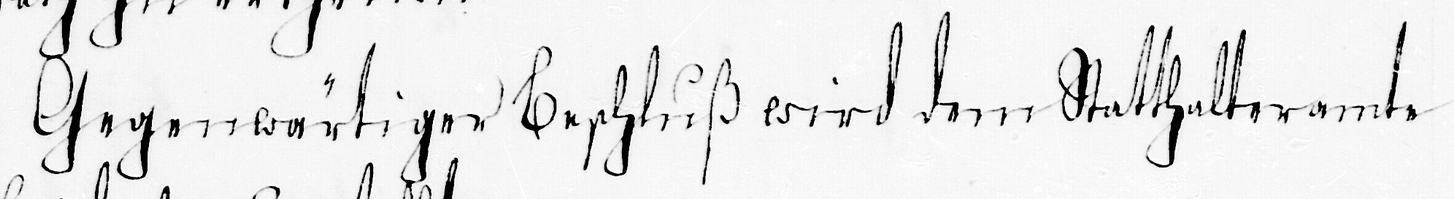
Gegenwärtiger Beschluß wird dem Statthalteramte
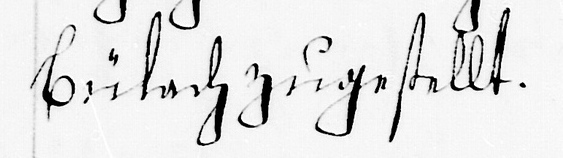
Bülach zugestellt.
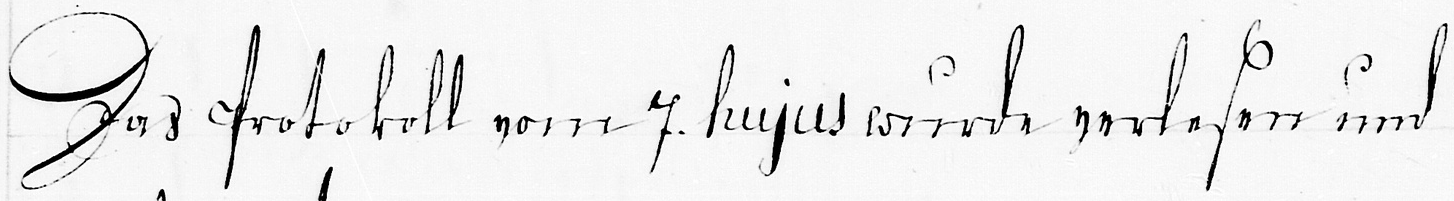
Das Protokoll vom 7. hujus wurde verlesen und
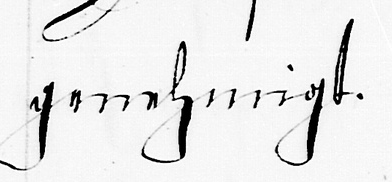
genehmigt.
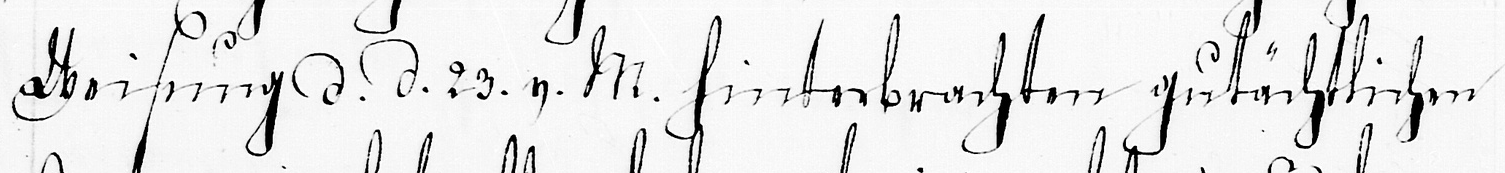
Weisung d. d. 23. v. M. hinterbrachten gutächtlichen
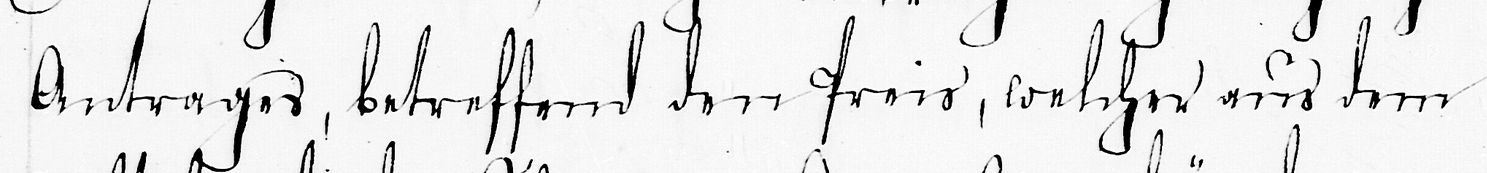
Antrages, betreffend den Preis, welcher aus dem
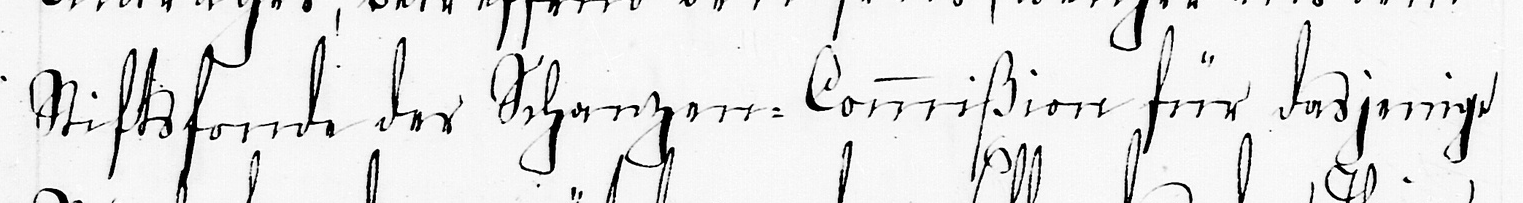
Stiftsfonde der Schanzen-Commißion für dasjenige
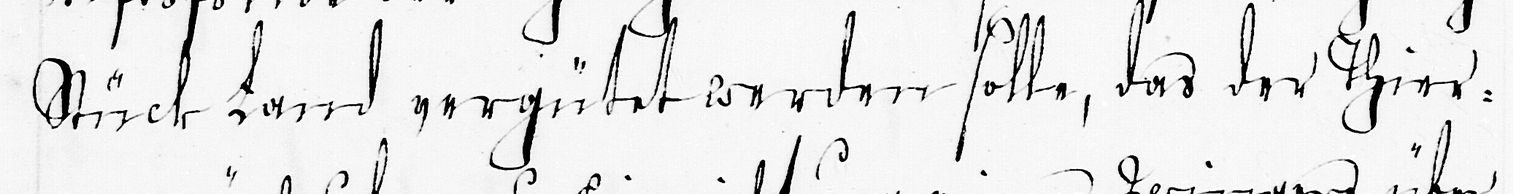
Stück Land vergütet werden solle, das der Thier¬
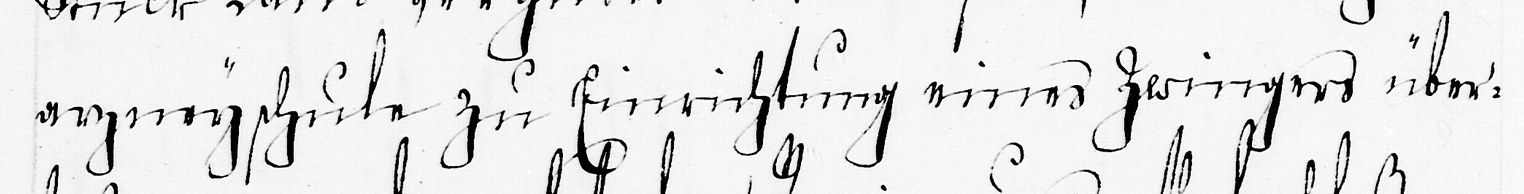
arzneyschule zu Einrichtung eines Zwingers über¬
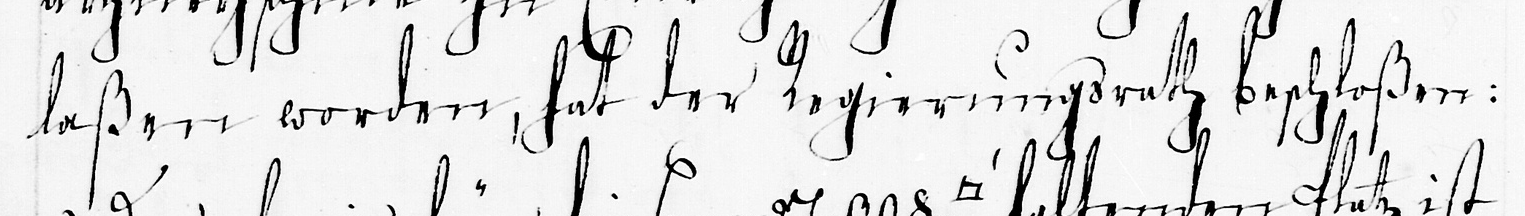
laßen worden, hat der Regierungsrath beschloßen:
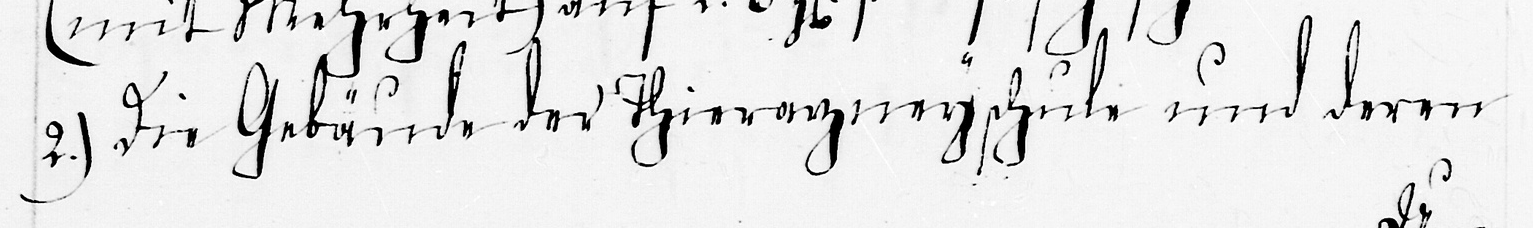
2.) Die Gebäude der Thierarzneyschule und deren
